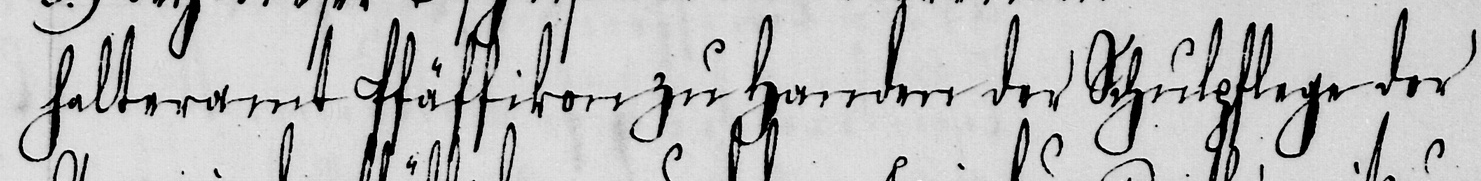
thalteramt Pfäffikon zu Handen der Schulpflege der
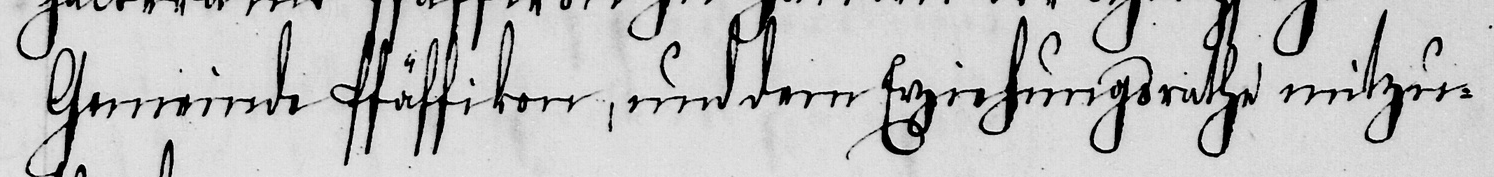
Gemeinde Pfäffikon, und dem Erziehungsrathe mitzu¬
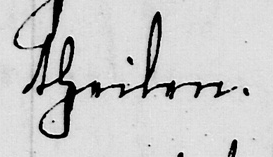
theilen.
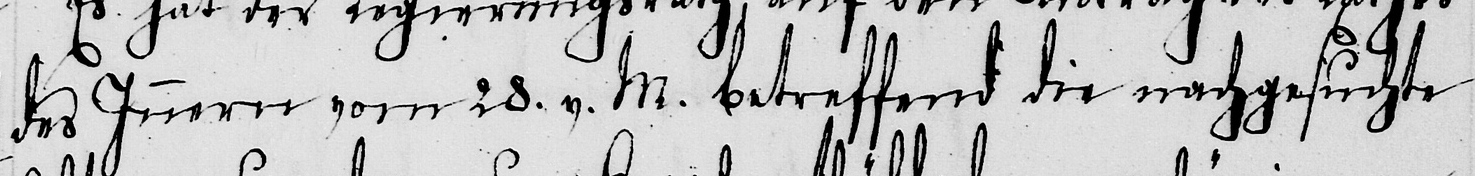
des Innern vom 28. v. M. betreffend die nachgesuchte
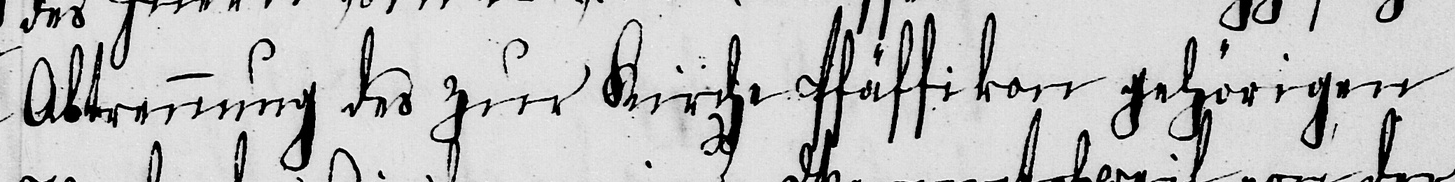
Abtrennung des zur Kirche Pfäffikon gehörigen
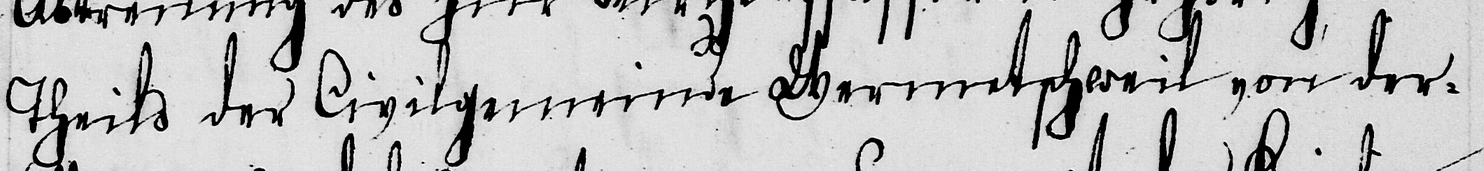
Theils der Civilgemeinde Wermetschweil von der¬
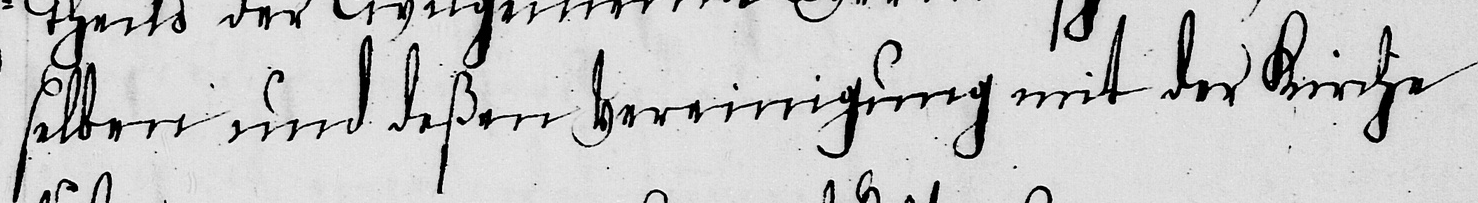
selben und deßen Vereinigung mit der Kirche
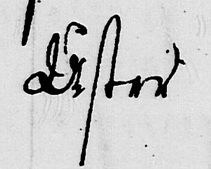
Uster
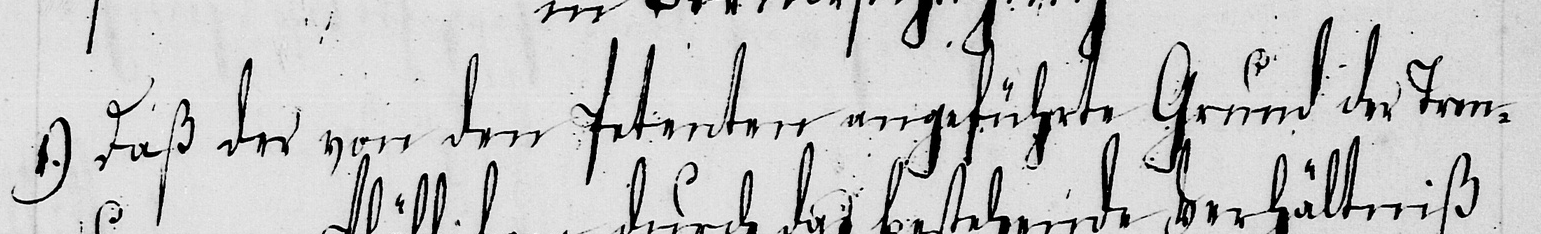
1.) Daß der von den Petenten angeführte Grund der Tren¬
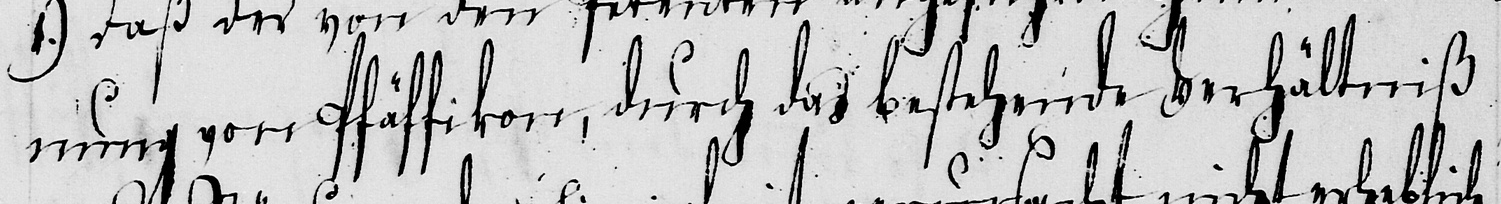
nung von Pfäffikon, durch das bestehende Verhältniß
